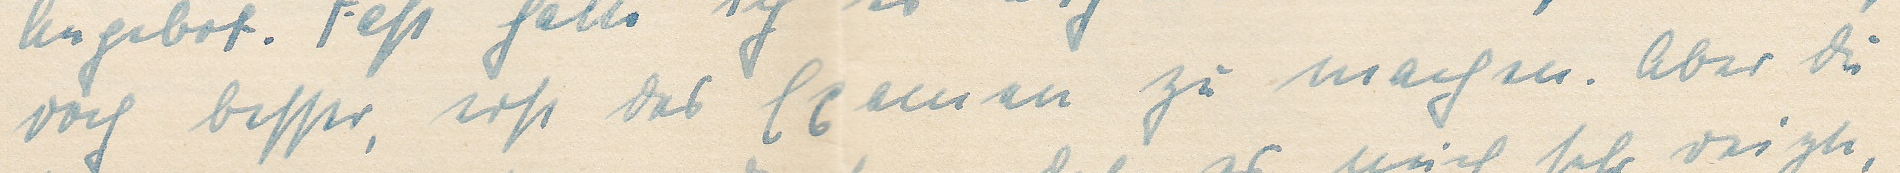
doch besser, erst das Examen zu machen. Aber du
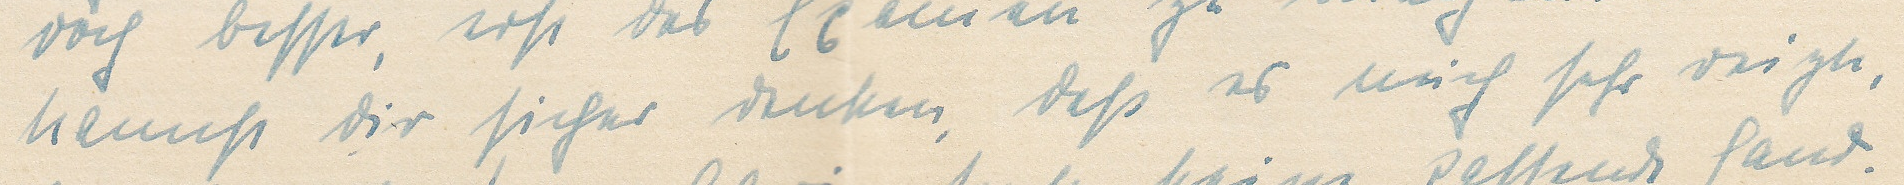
kannst dir sicher denken, daß es mich sehr reizte
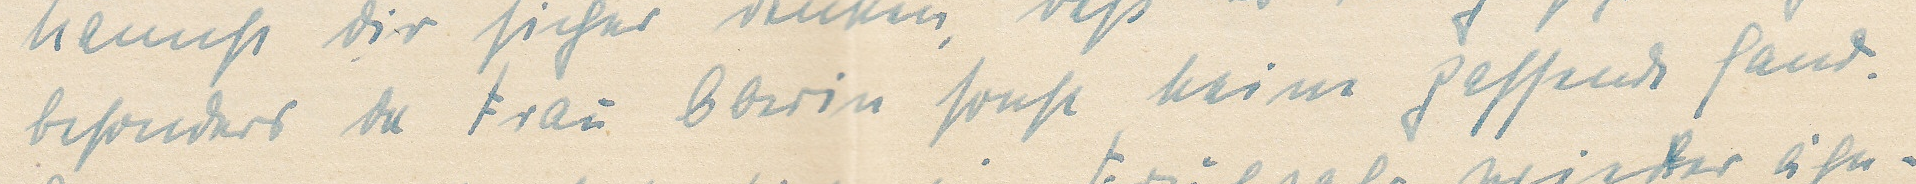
besonders da Frau Oberin sonst keine passend fand.
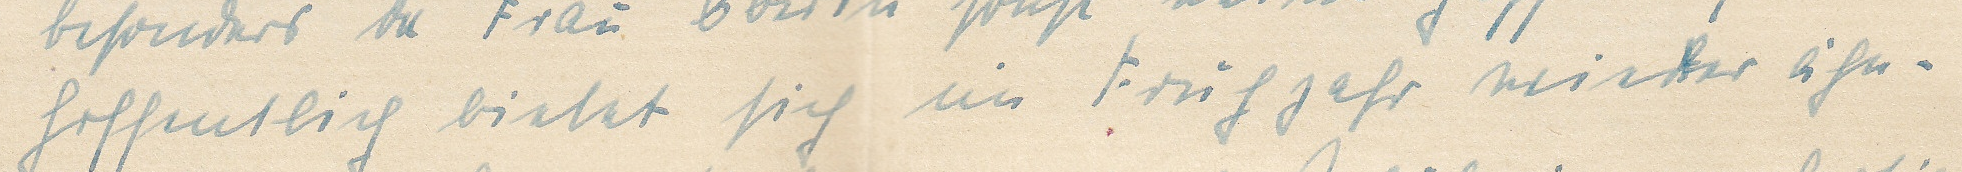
Hoffentlich bietet sich im Frühjahr wieder ähn-
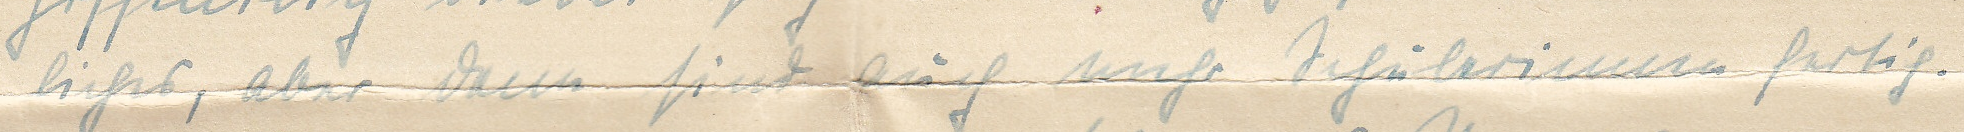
liches, aber dann sind auch mehr Schülerinnen fertig.
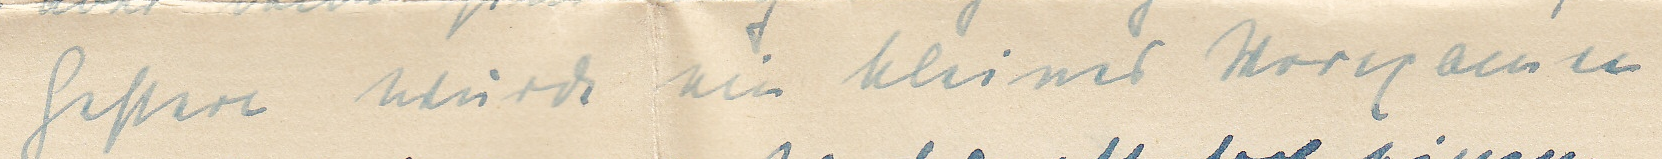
Gestern wurde ein kleines Vorexamen
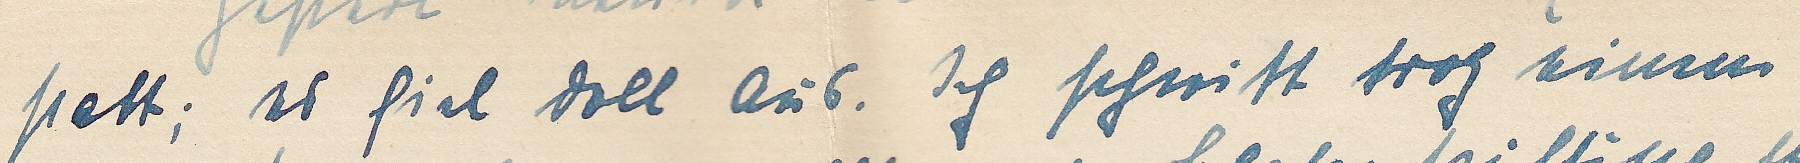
statt; es fiel doll aus. Ich schnitt trotz einem
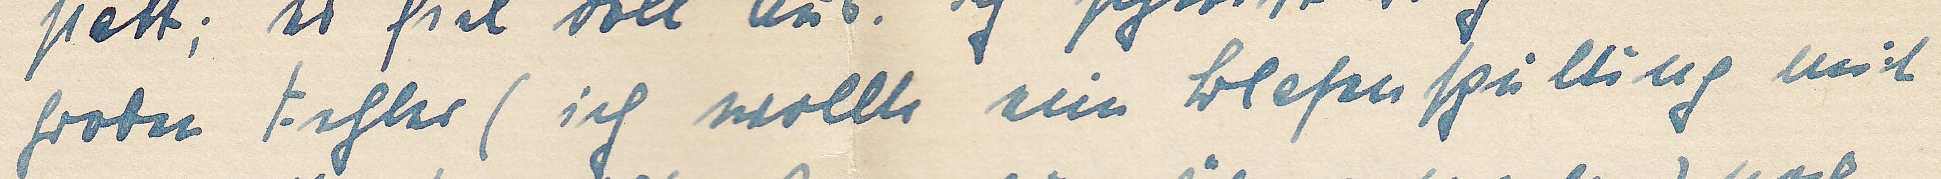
grobben Fehler (ich wollte eine Blaßenspülung mit
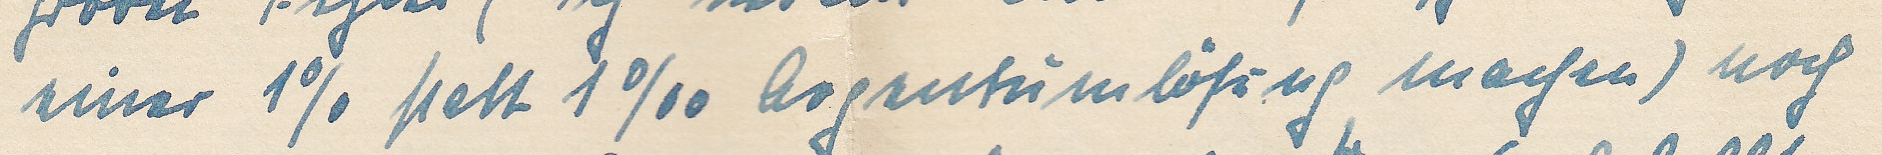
einer 1 % statt 1 %% Agentumlösung machen) noch
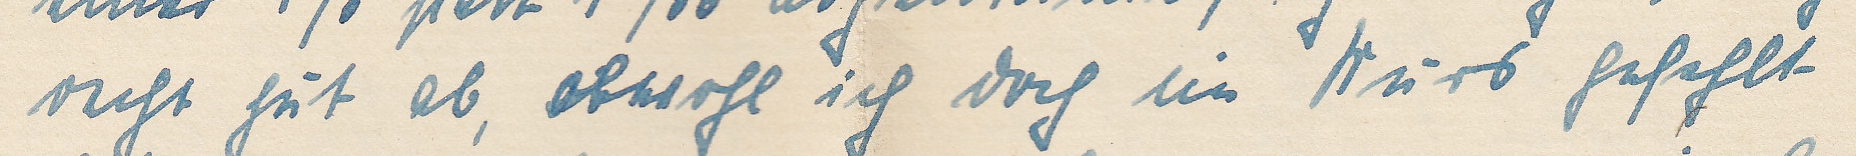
recht gut ab, obwohl ich doch im Kurs gefehlt
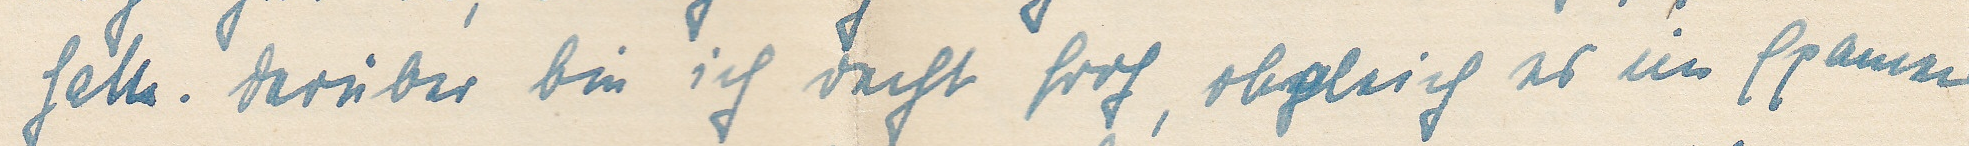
hatte. Darüber bin ich recht froh, obgleich es im Examen
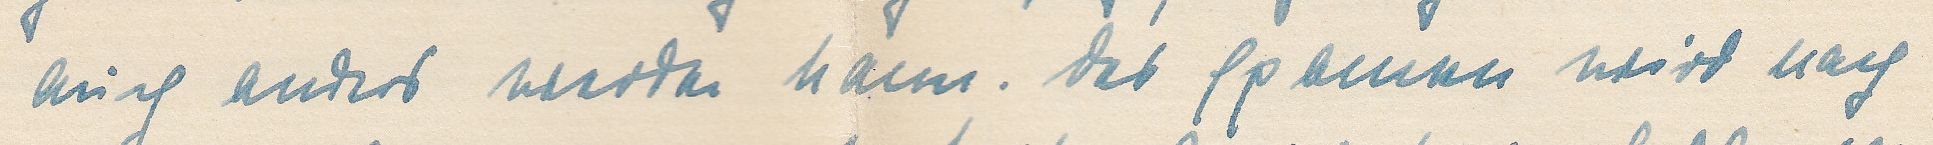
auch anders werden kann. Das Examen wird nach
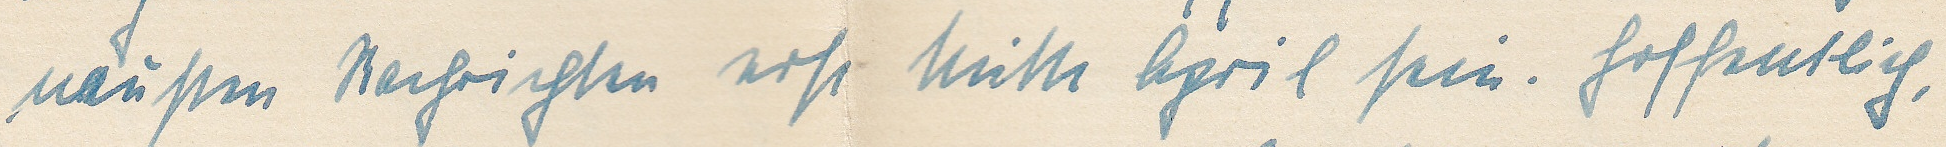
neußten Nachrichten erst Mitte April sein Hoffentlich,
